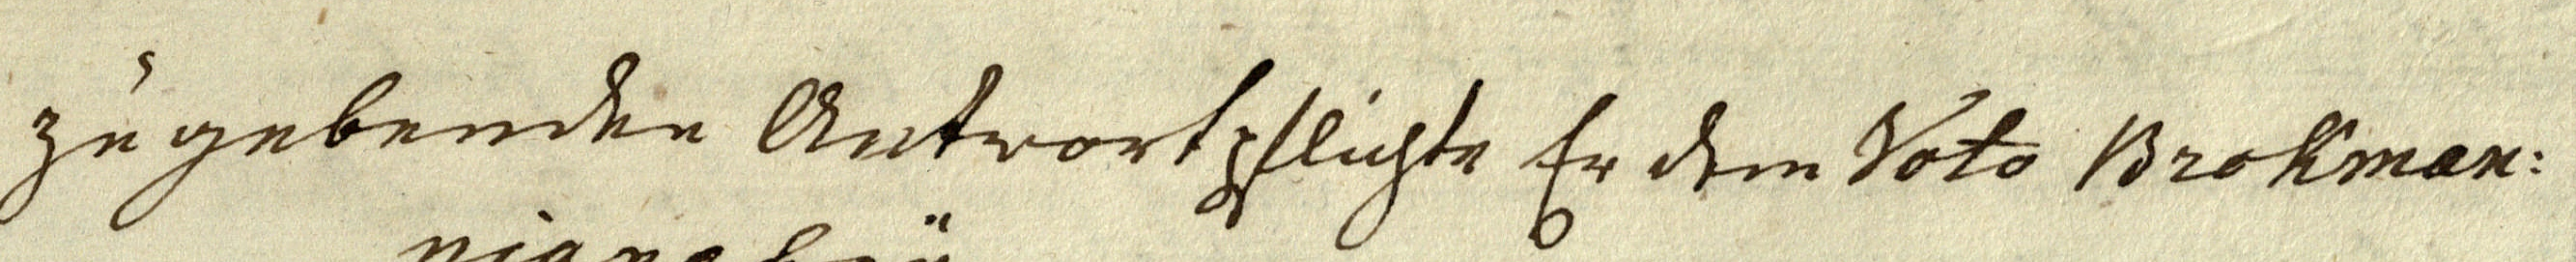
zu gebenden Antwort pflichte Er dem Voto Brokman¬
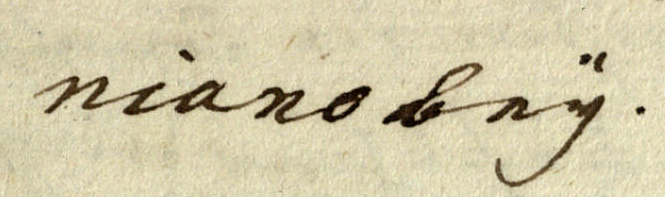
niano beÿ.
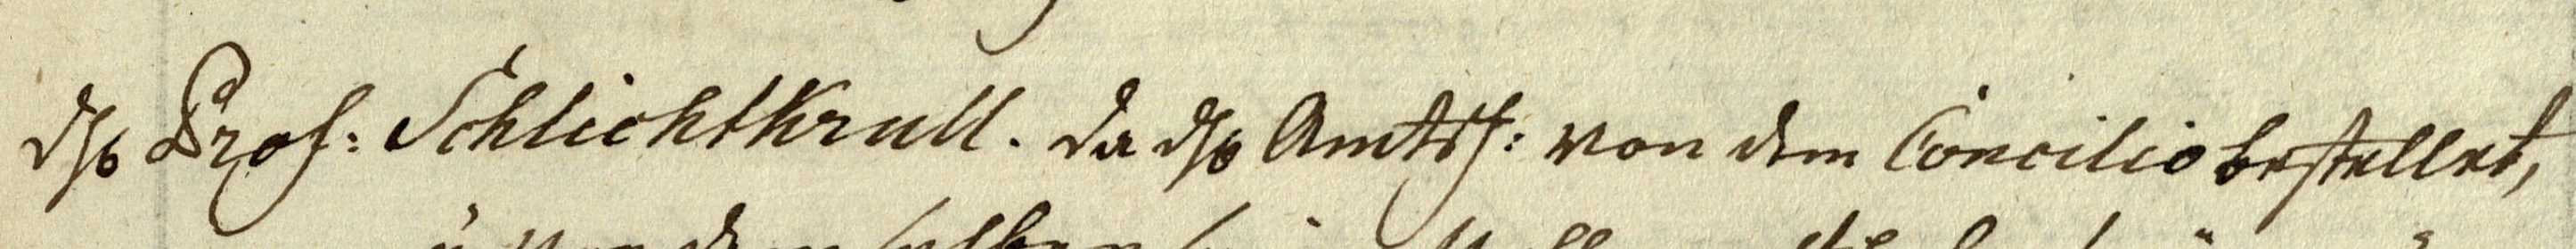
dh Prof. Schlichtkrull. Da dh Amtsh. von dem Concilio bestellet,
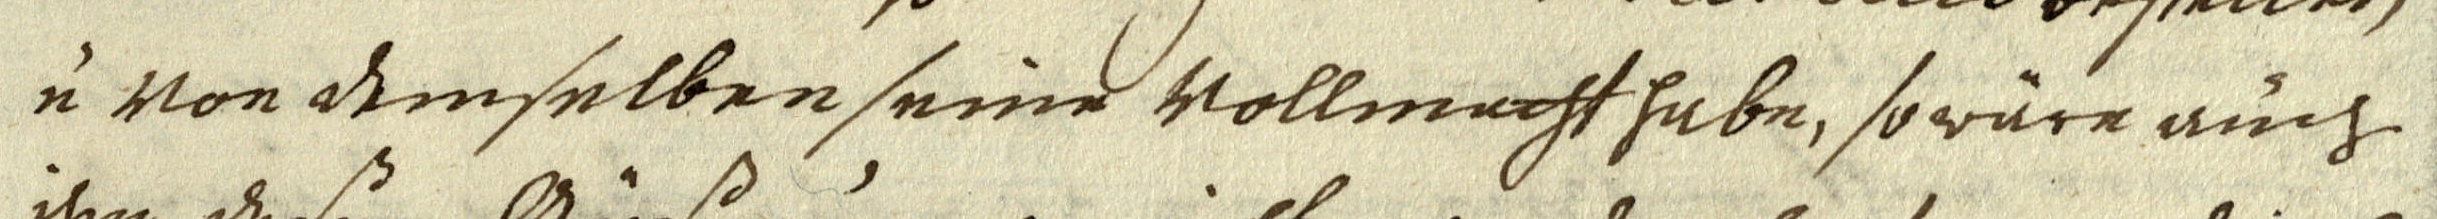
u von demselben seine Vollmacht habe, so wäre auch
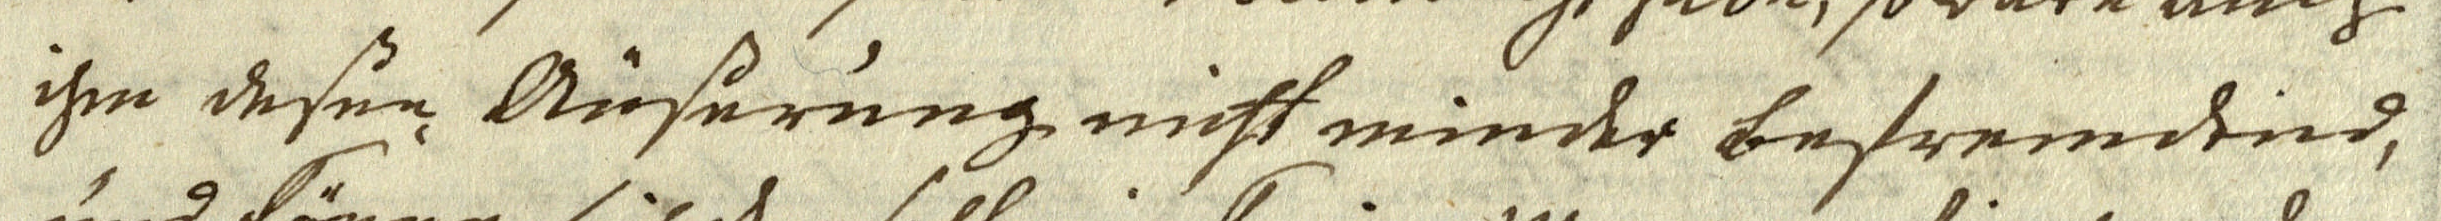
ihm deßen Äußerung nicht minder befremdend,
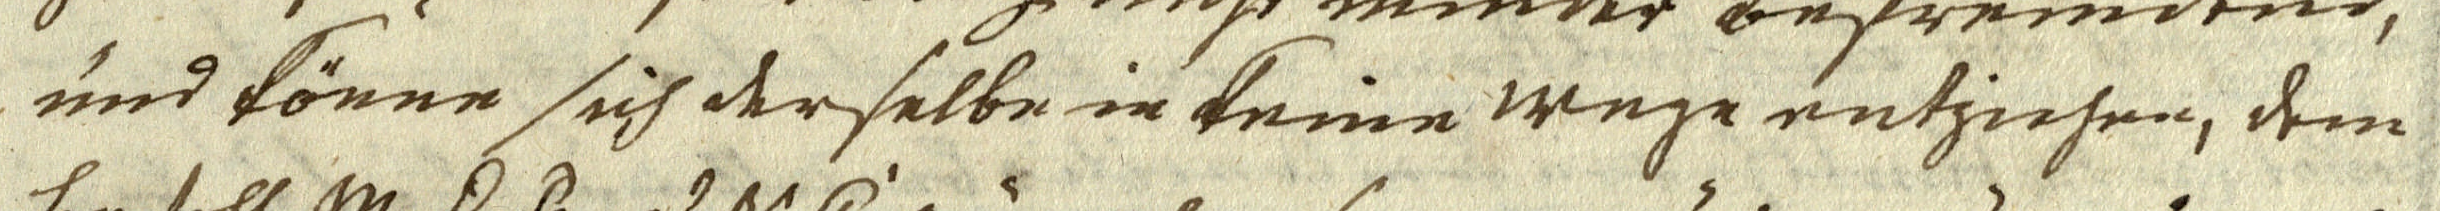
und könne sich derselbe in keine wege entziehen, dem
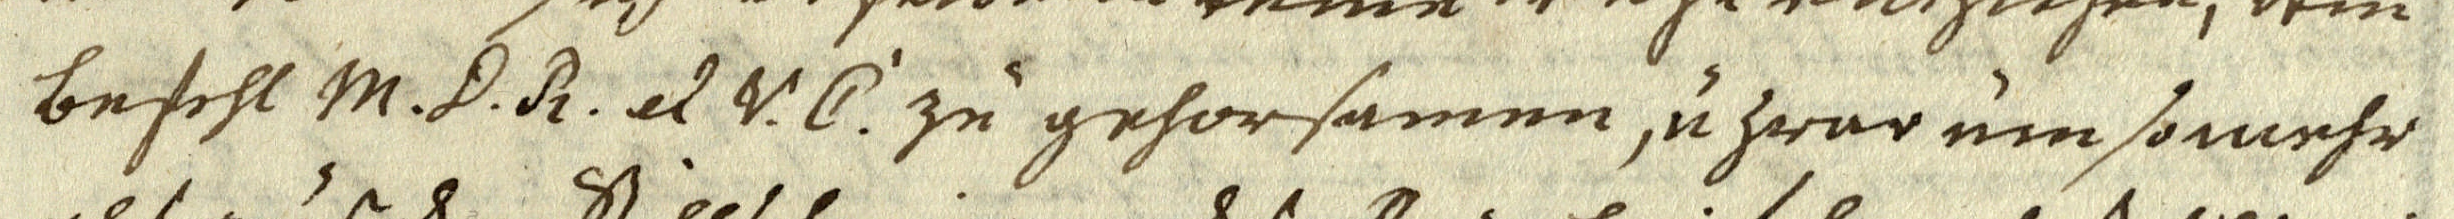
Befehl M. D. R. et V. C. zu gehorsamen, u zwar umsomehr
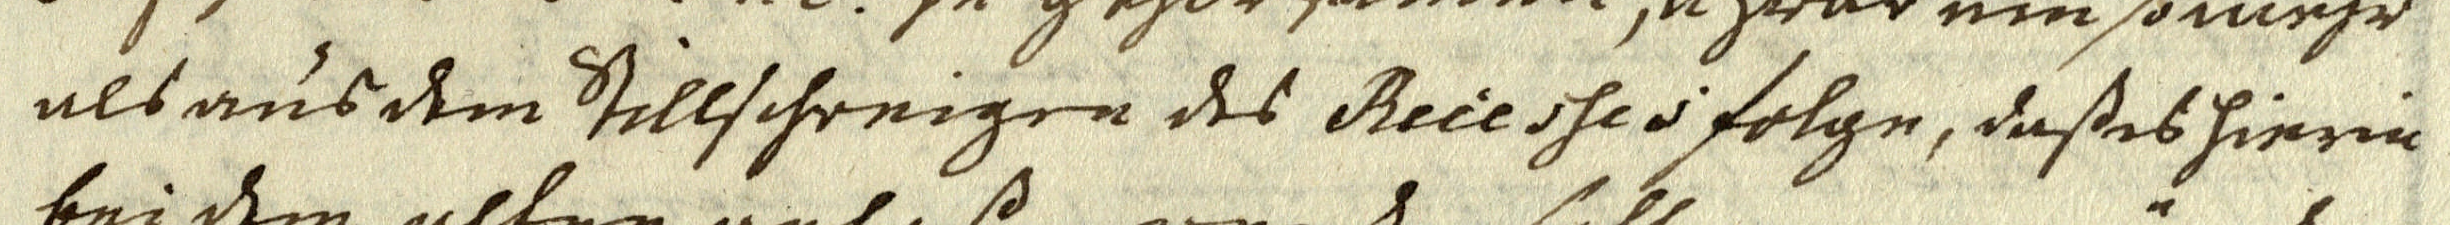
als aus dem Stillschweigen des Recesses folge, daß es hierin
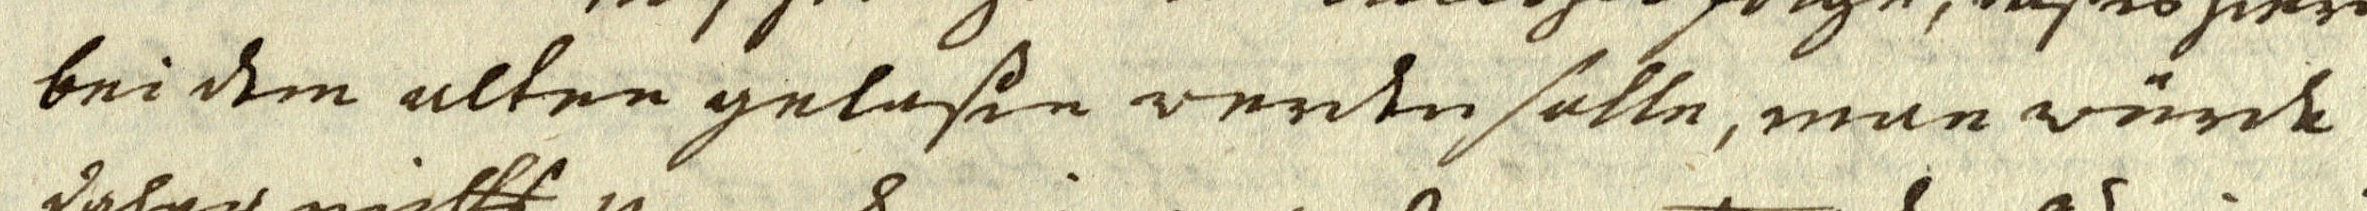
bei dem alten gelaßen werden solle, man würde
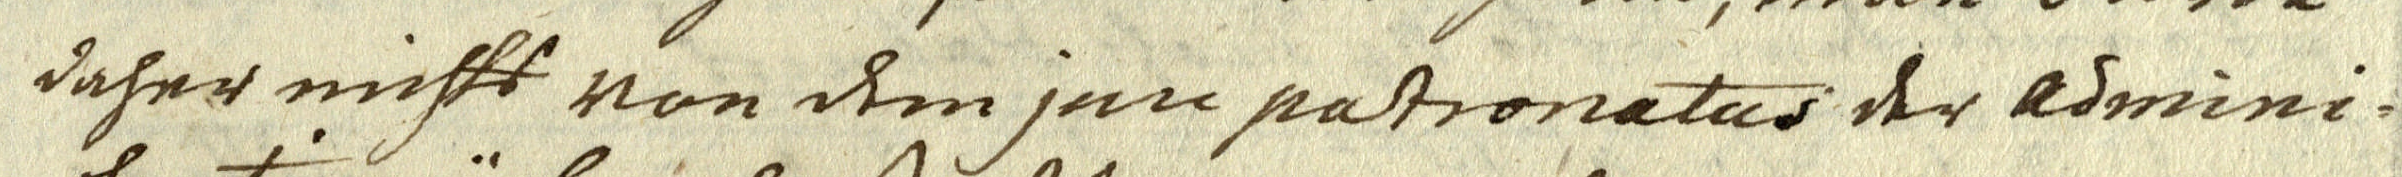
daher nichts von dem jure patronatus der Admini¬
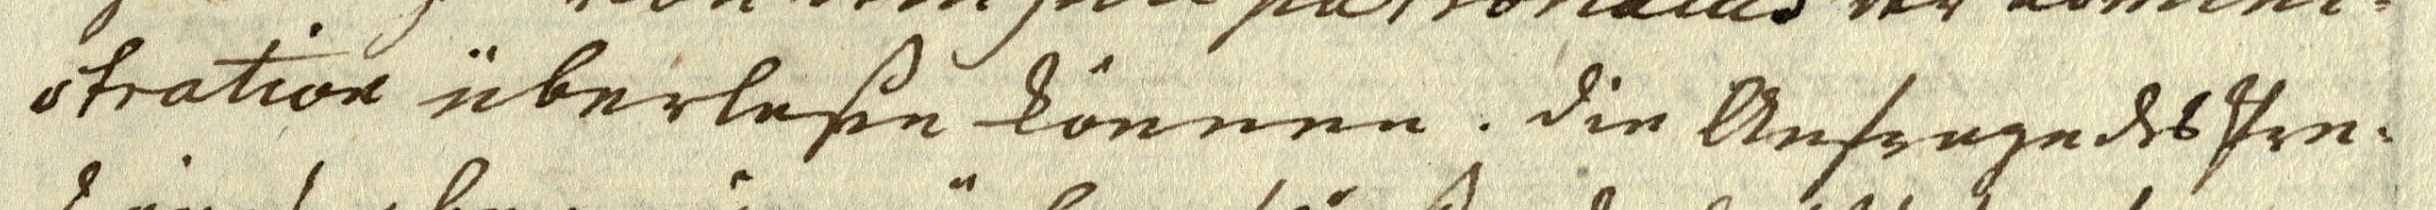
stration überlaßen können. Die Anfrage des Pre¬
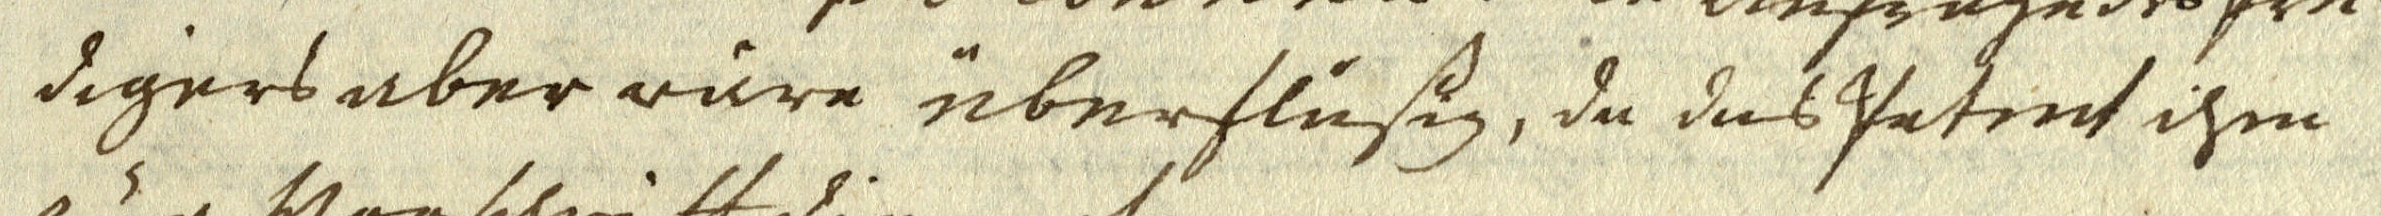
digers aber wäre überflüßig, da des Patent ihm
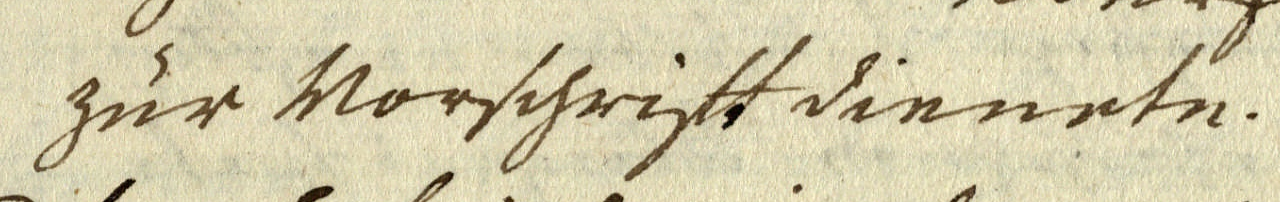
zur Vorschrift dienete.
